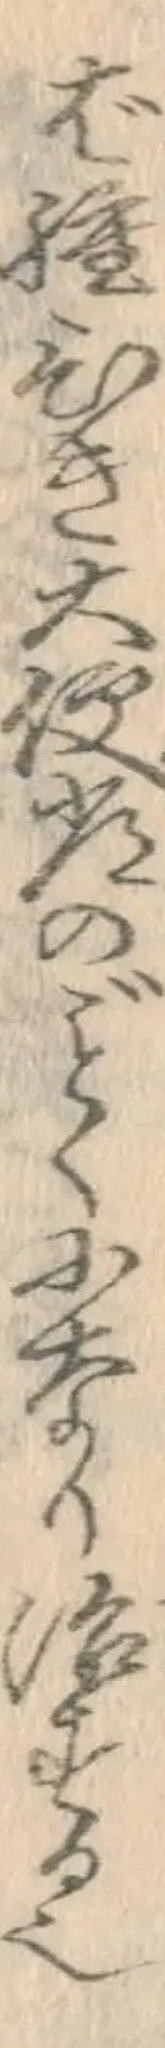ば腫ひき大便常のごとくになり治する也
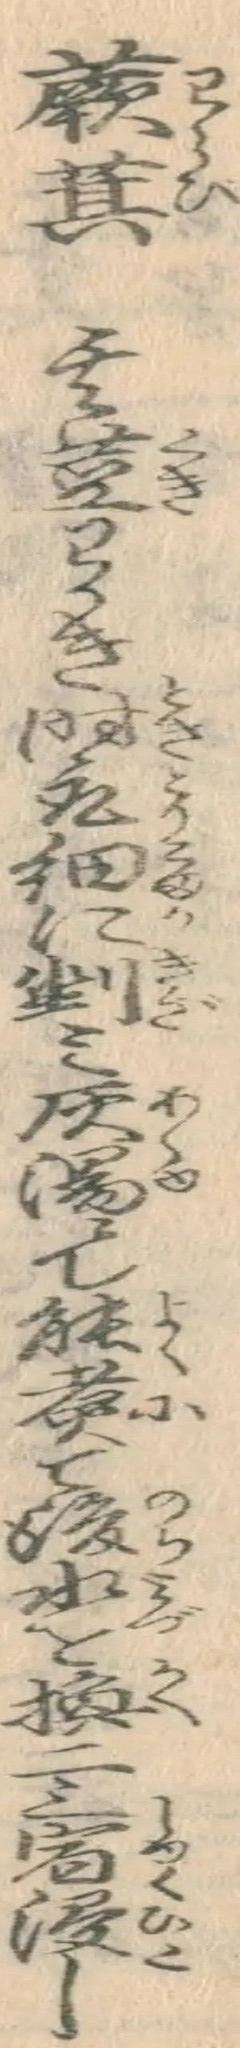蕨萁其茎わかき時取細に剉み灰湯にて能煑て後水を換二三宿浸し
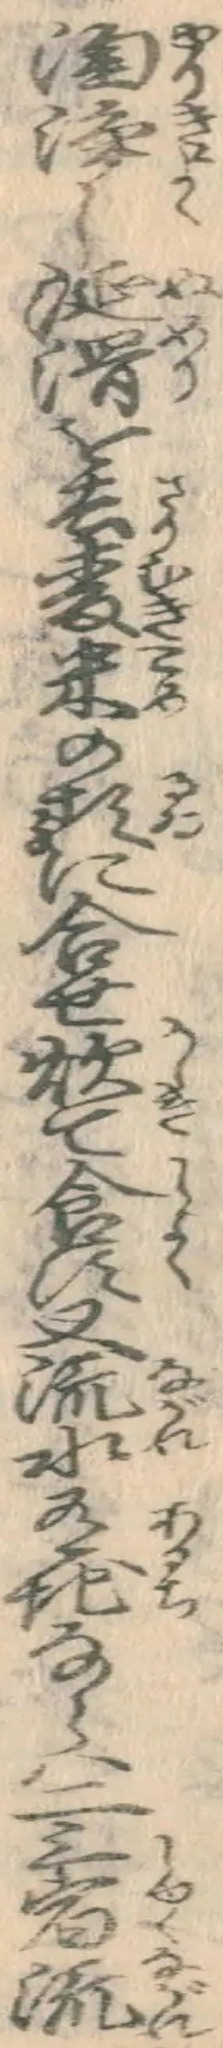淘浄し涎滑を去麦米の類に合せ炊て食す又流水有地ならは二三宿流
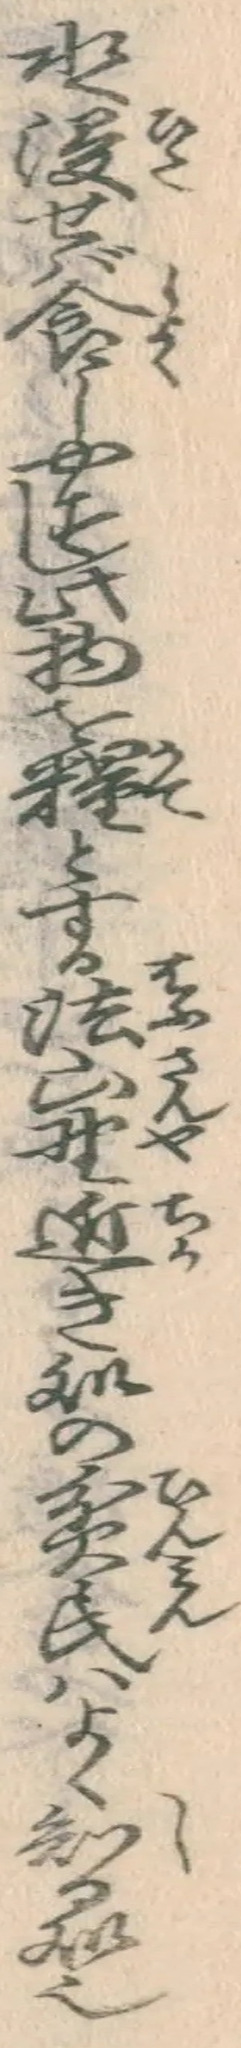水へ浸せば食しやすし此物を糧とする法山野近き処の貧民はよく知る処也
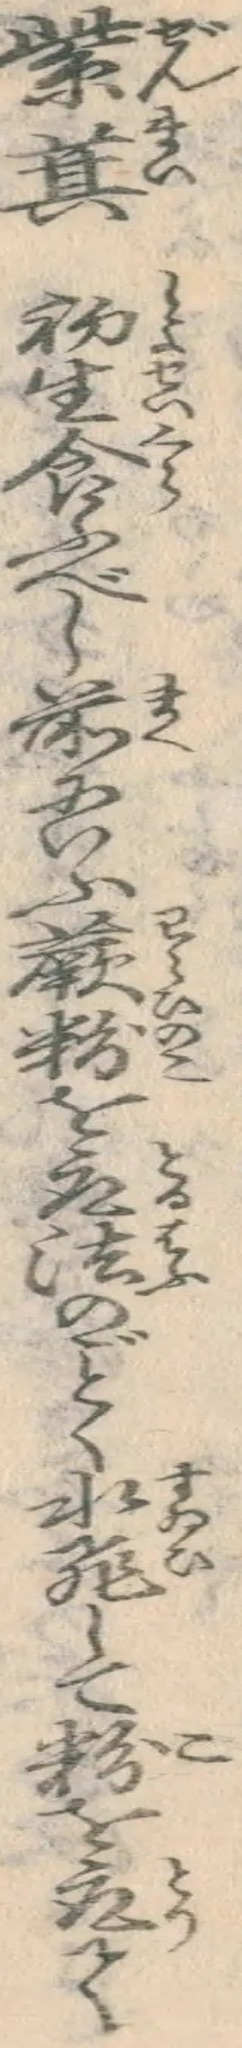紫萁初生食ふべし前にいふ蕨粉を取法のごとく水飛して粉を取て
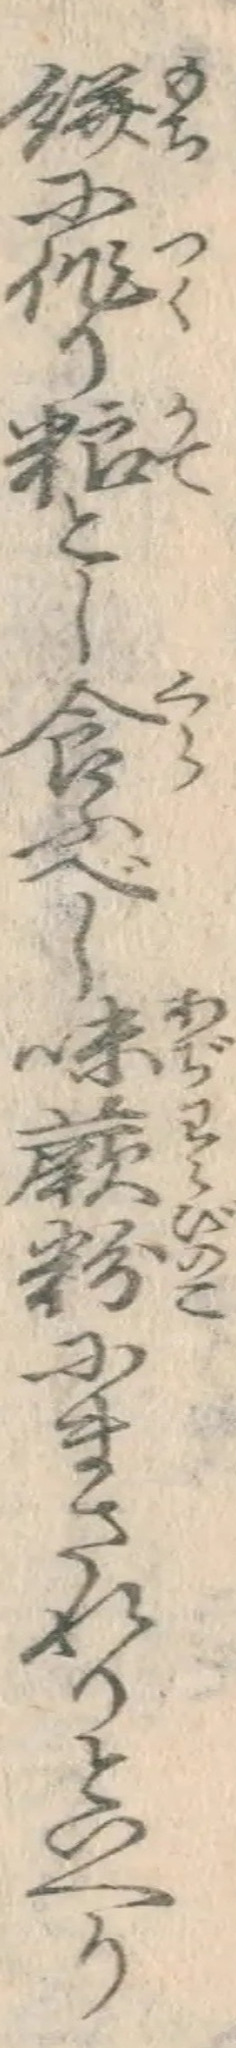餅に作り粮とし食ふべし味蕨粉にまされりといへり
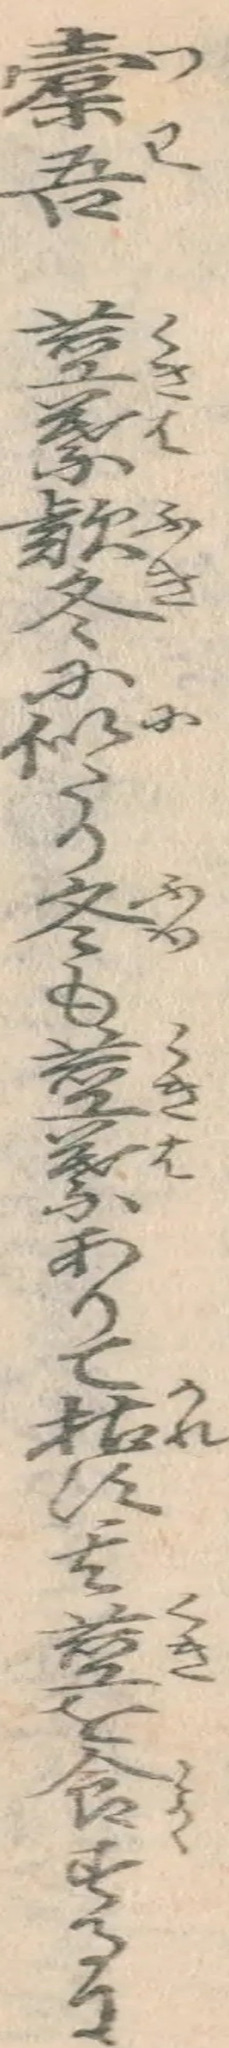槖吾茎葉款冬に似たり冬も茎葉ありて枯す其茎を食するに
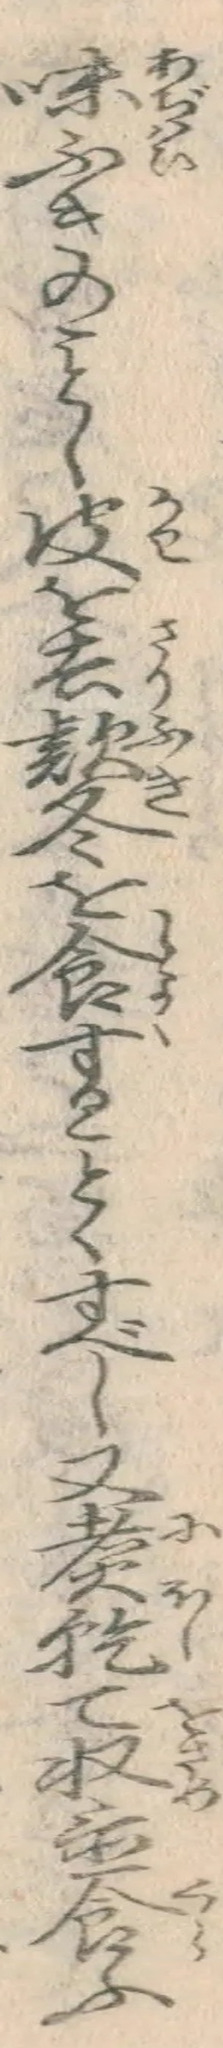味ふきのことし皮を去款冬を食することくすべし又煑乾て収置食ふ
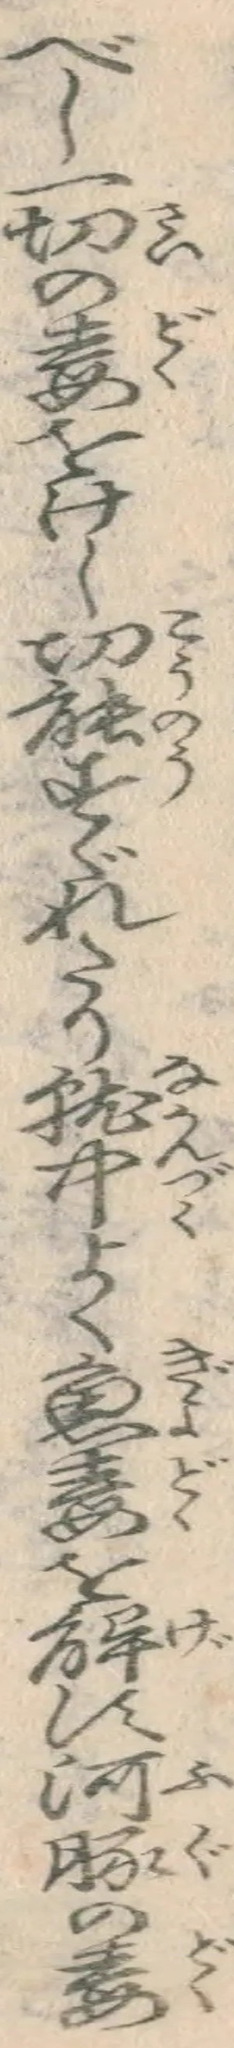べし一切の毒をけし功能すぐれたり就中よく魚毒を解す河豚の毒
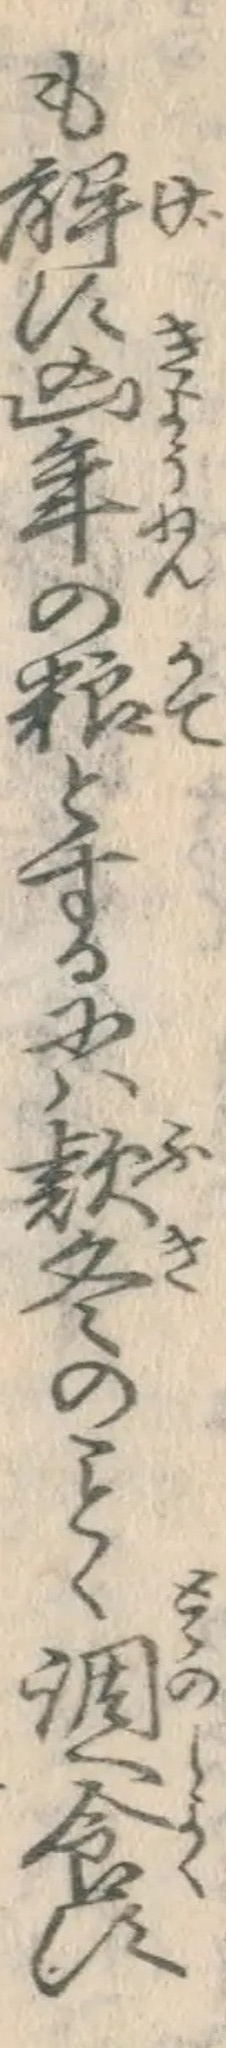も解す凶年の粮とするには款冬のことく調へ食す
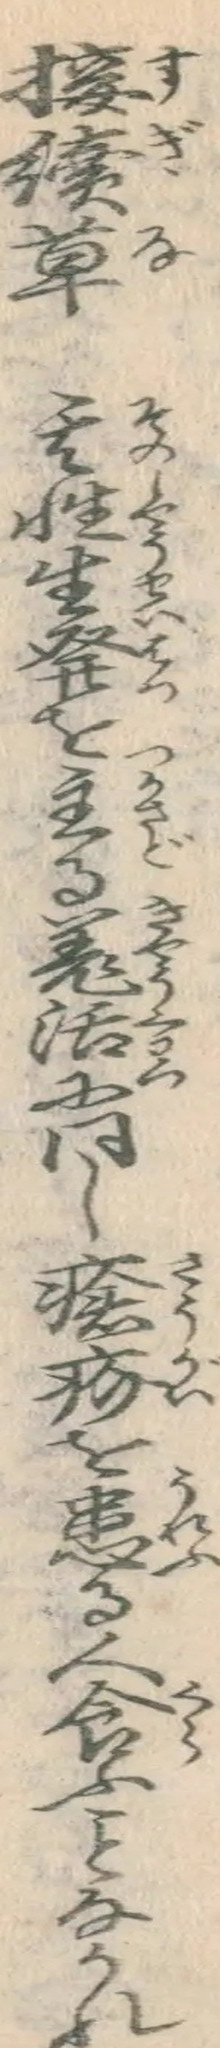接続草其性生発を主る羗活に同し瘡疥を患る人食ふことなかれ
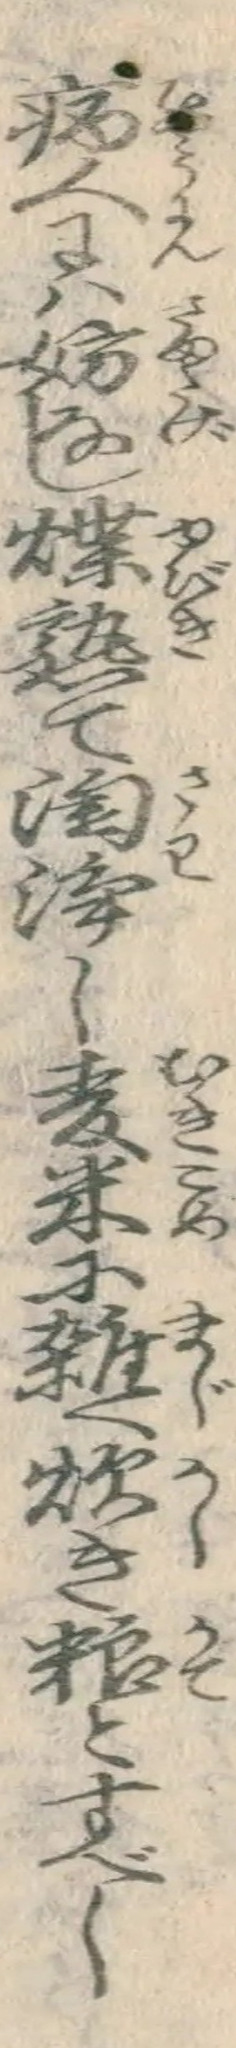病人には妨なし煠熟て淘浄し麦米に雑へ炊き粮とすべし
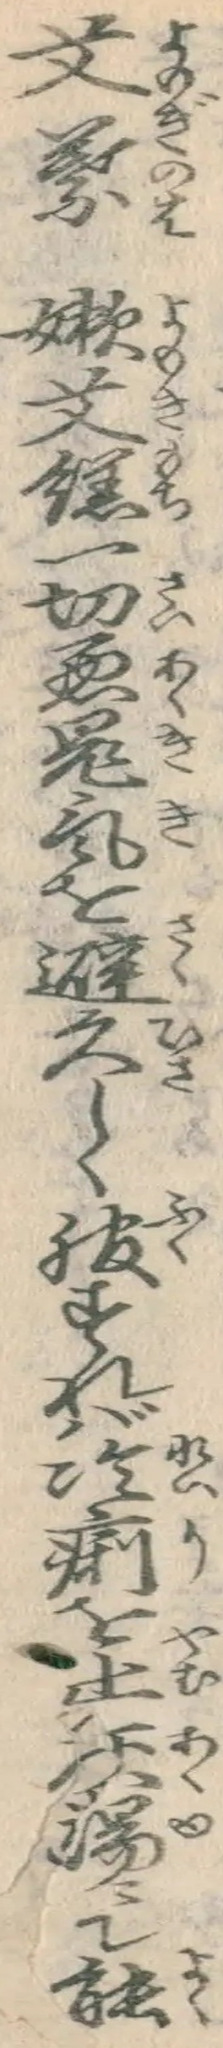艾葉嫰艾餻一切悪鬼気を避久しく服すれば冷痢を止灰湯にて能

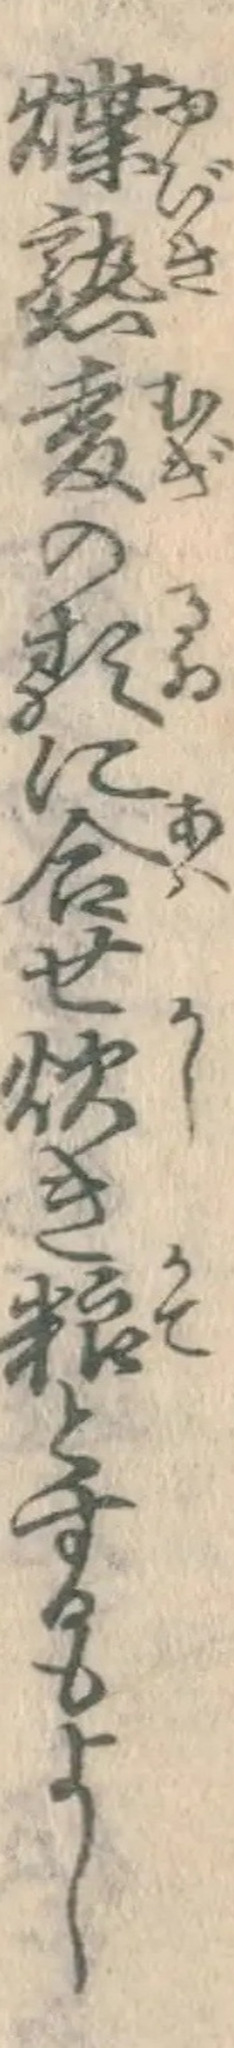煠熟麦の類に合せ炊き粮とするもよし
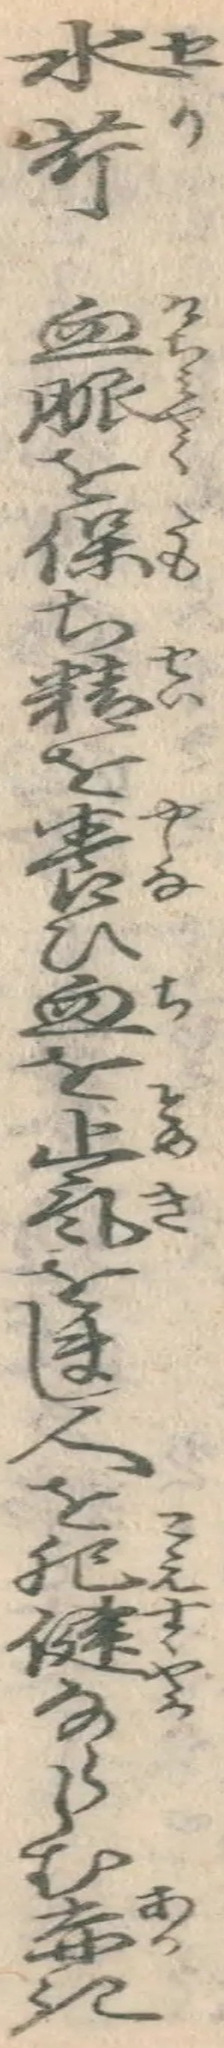水芹血脈を保ち精を養ひ血を止気をまし人を肥健ならしむ赤き
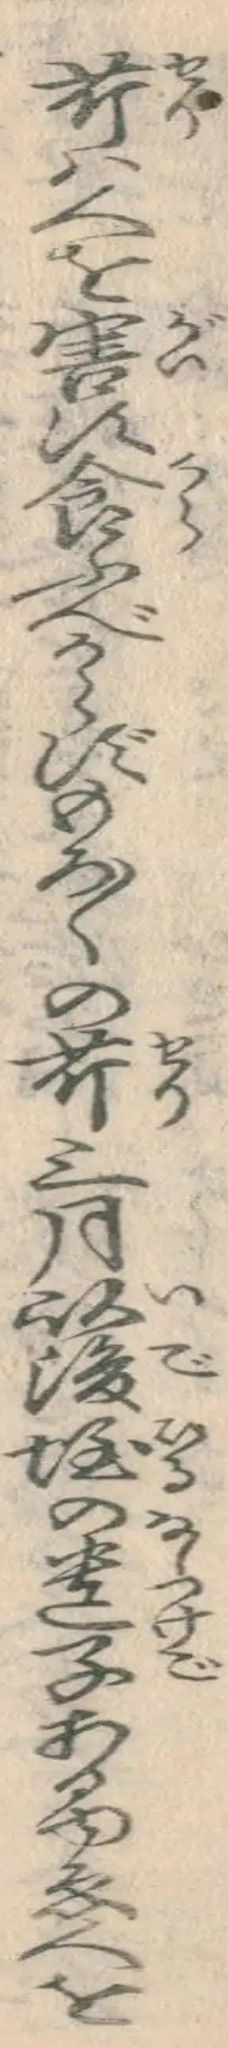芹は人を害す食ふべからずもろ〳〵の芹三月以後蛭の迷子あるゆゑ人を
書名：経済をしへ草
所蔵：国立国会図書館 National Diet Library, JAPAN
